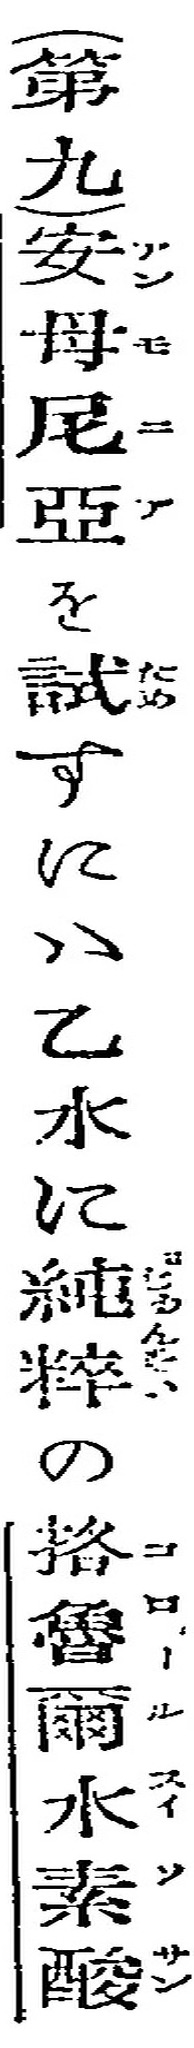[第九]安母尼亞を試すには乙水に純粋の挌魯爾水素酸
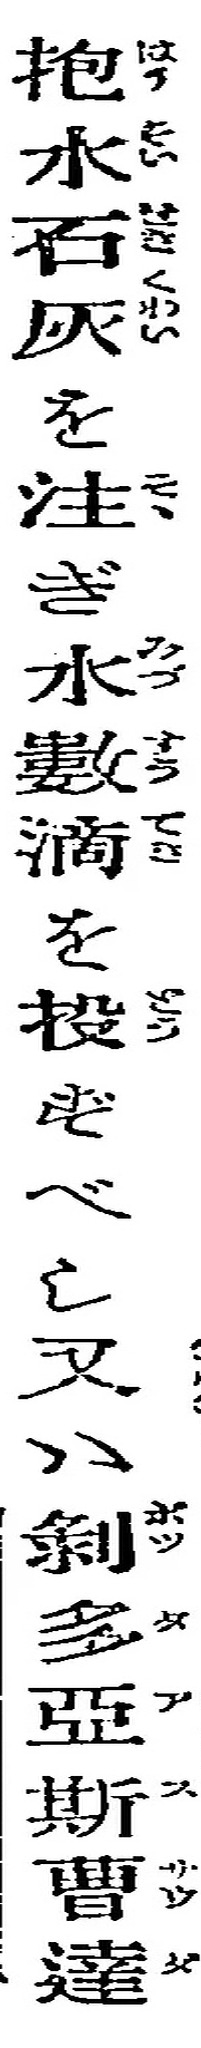抱水石灰を注ぎ水数滴を投ずべし又は剥多亞斯曹達
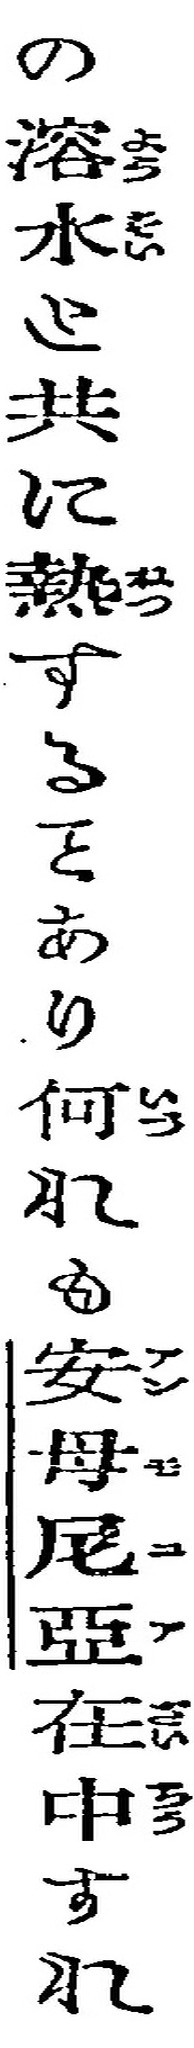の容水と共に熱することあり何れも安母尼亞在中すれ
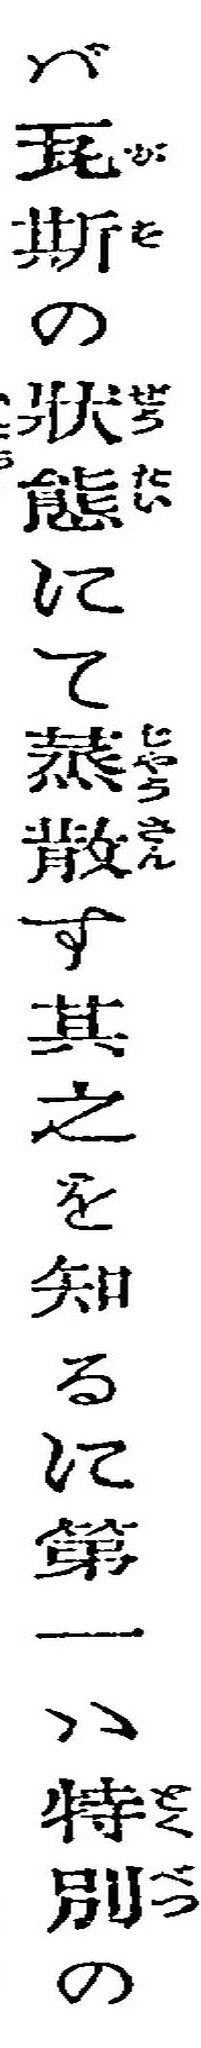ば瓦斯の状態にて蒸散す其之を知るに第一は特別の
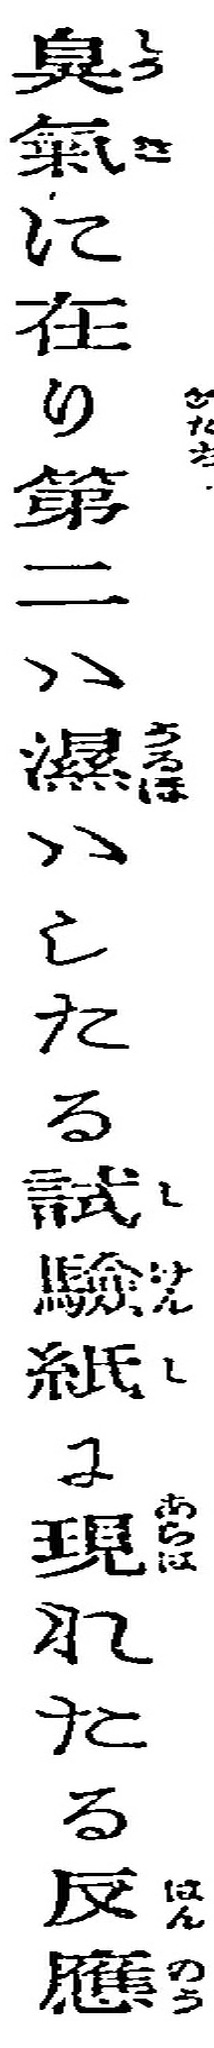臭気に在り第二は濕はしたる試験紙に現れたる反應
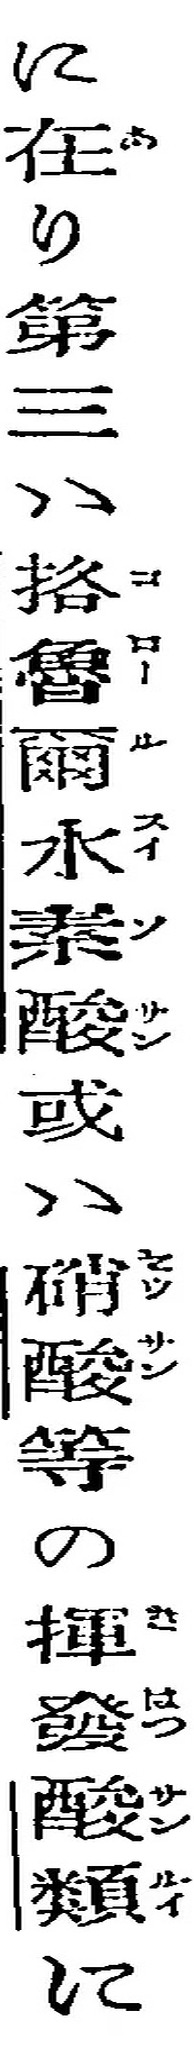に在り第三は挌魯爾水素酸或は硝酸等の揮發酸類に
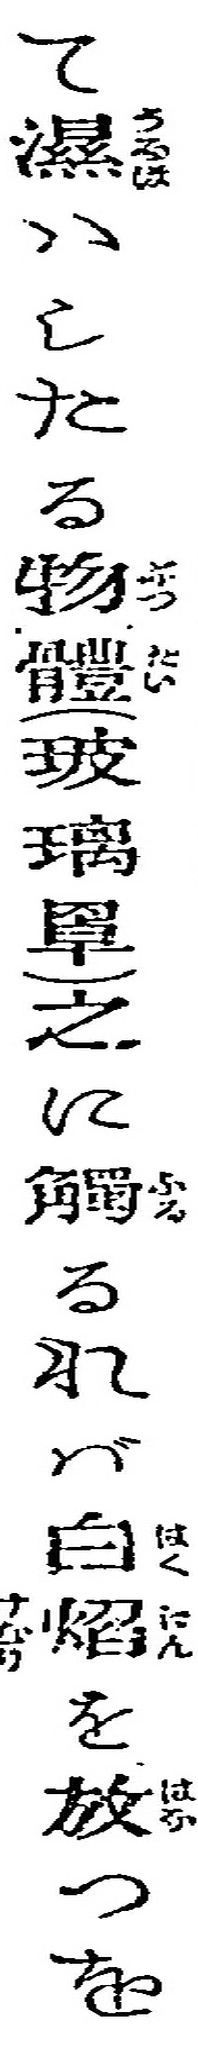て濕はしたる物體[玻璃罩]之に觸るれば白焰を放つを
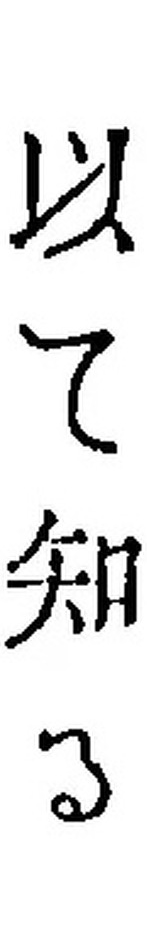以て知る
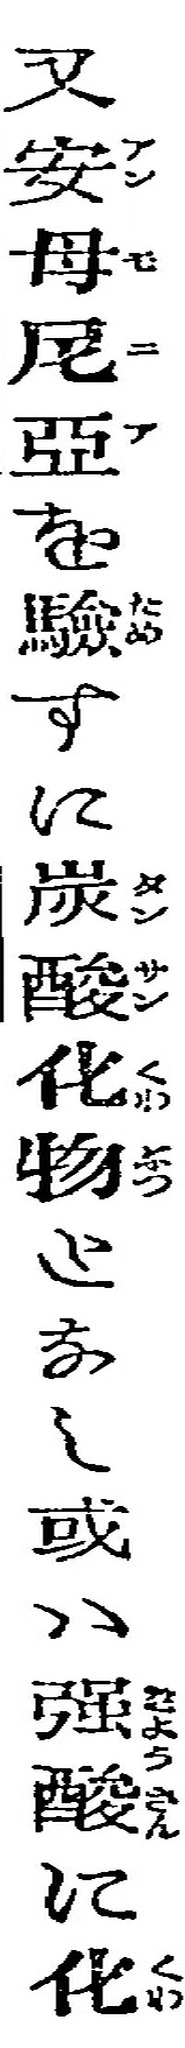又安母尼亞を試すに炭酸化物となし或は強酸に化
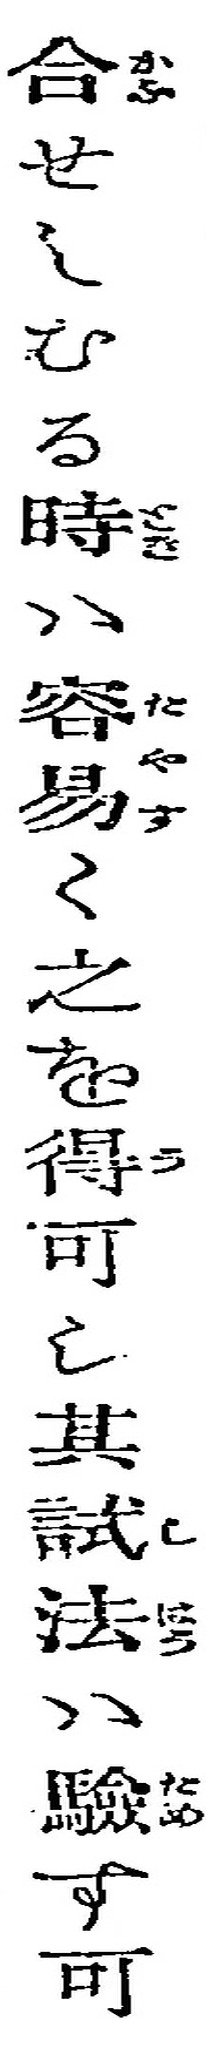合せしむる時は容易く之を得可し其試法は験す可
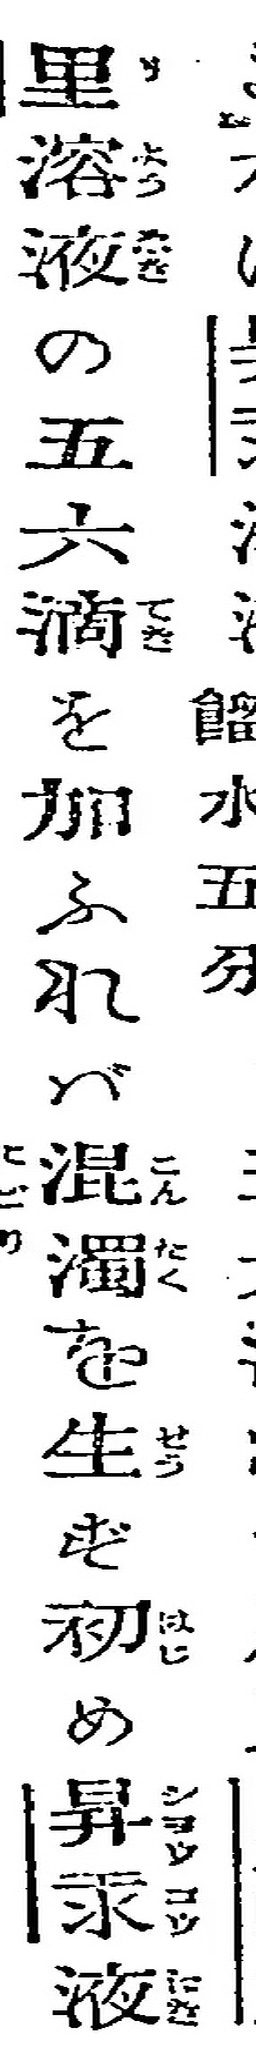溶液の五六滴を加ふれば混濁を生ず初め昇汞液

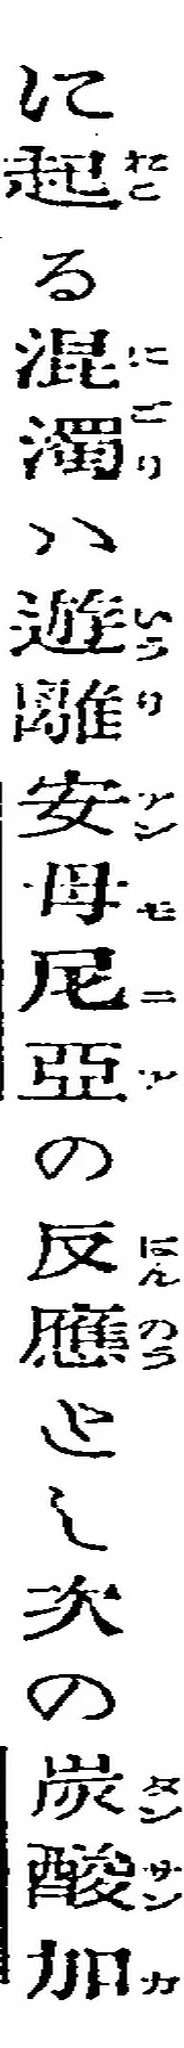に起る混濁は遊離安母尼亞の反應とし次の炭酸加
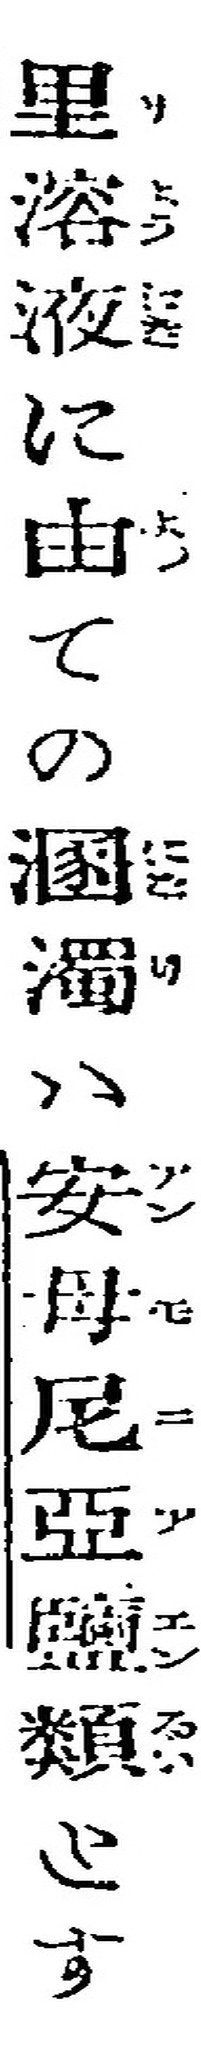里溶液に由ての溷濁は安母尼亞鹽類とす
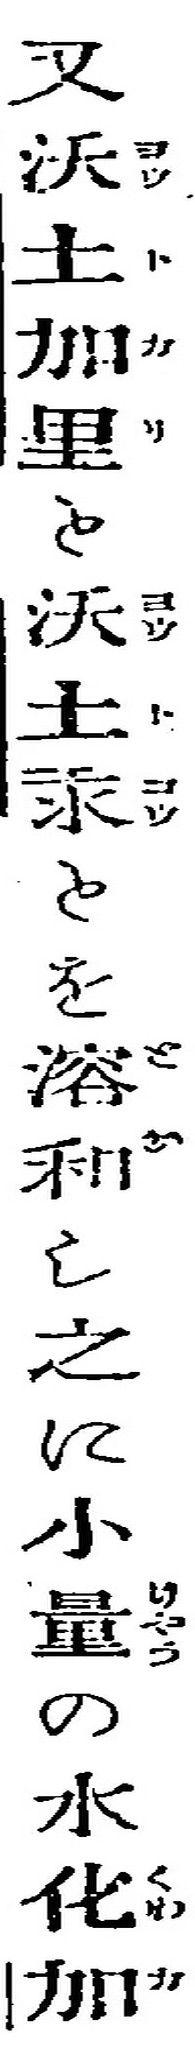又沃土加里と沃土汞とを溶和し之に小学量の水化加
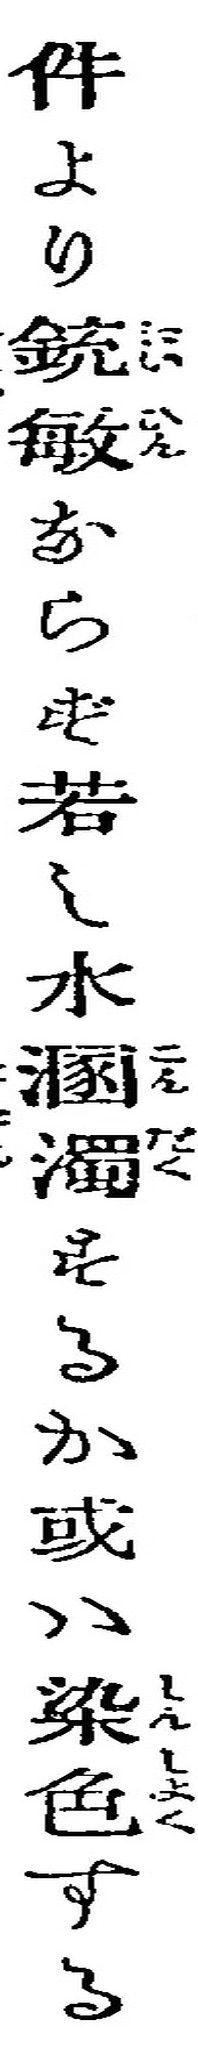里銃敏ならず若し水溷濁するか或は染色する
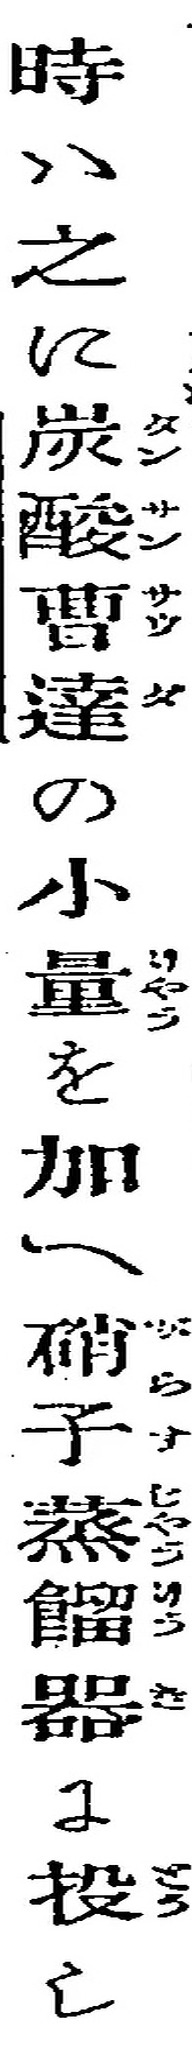時は之に炭酸曹達の小量を加へ硝子蒸餾器に投し
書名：飲水の心得 : 伝染病の予防
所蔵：国立国会図書館 National Diet Library, JAPAN
